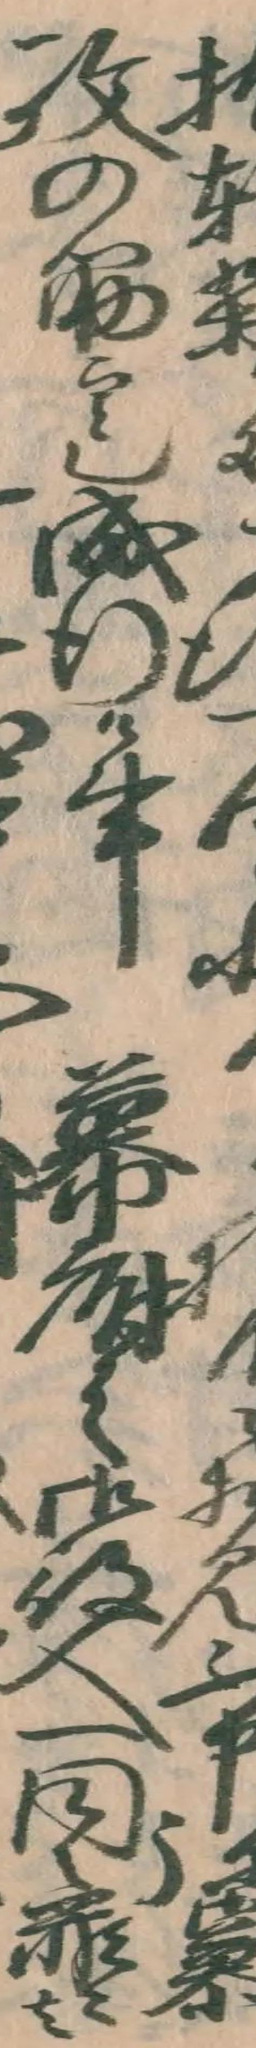政の筋而已成行候事幕府之御役人一同之罪ニ者
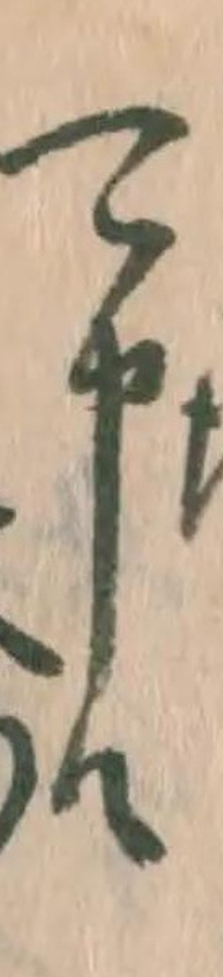可申候
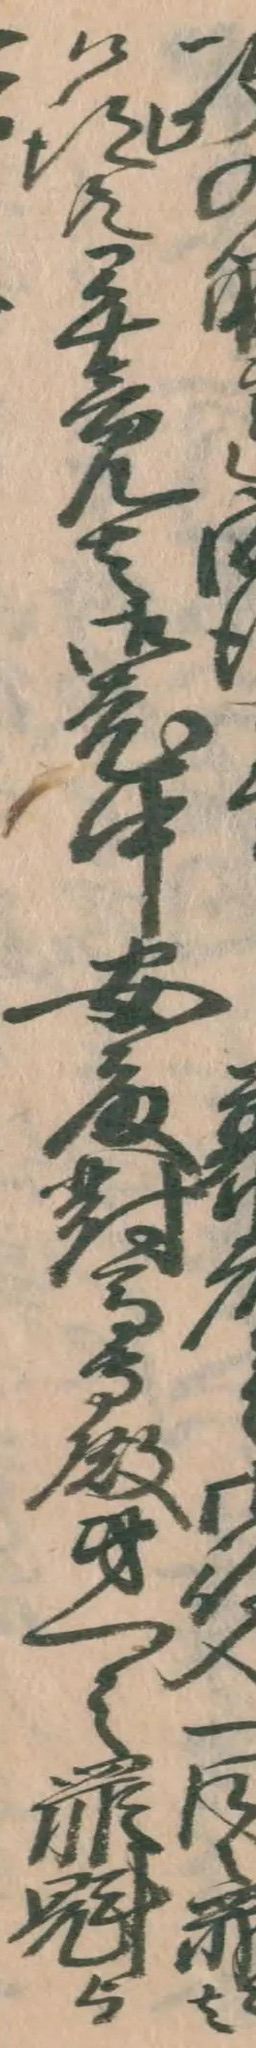候得共畢竟者御老中安藤對馬守殿第一之罪魁と
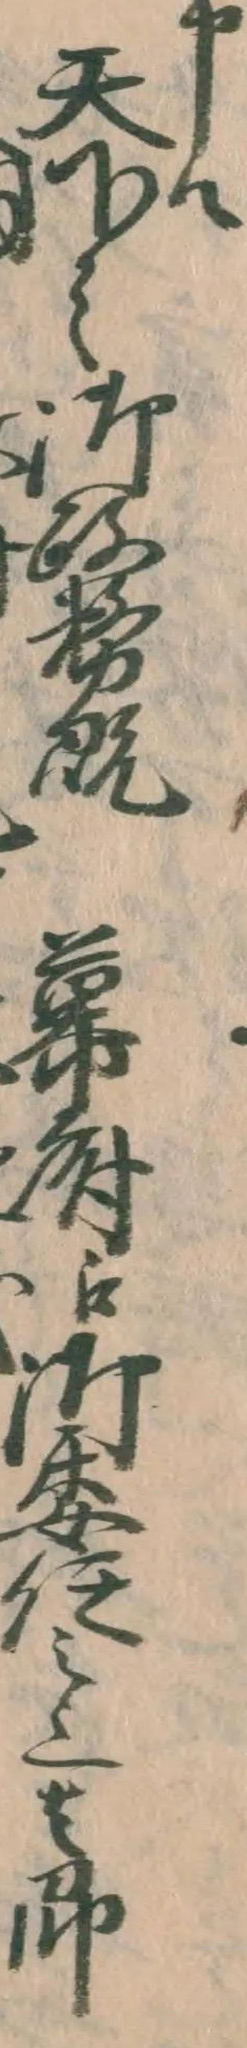天下之御政務既幕府江御委任之上者即
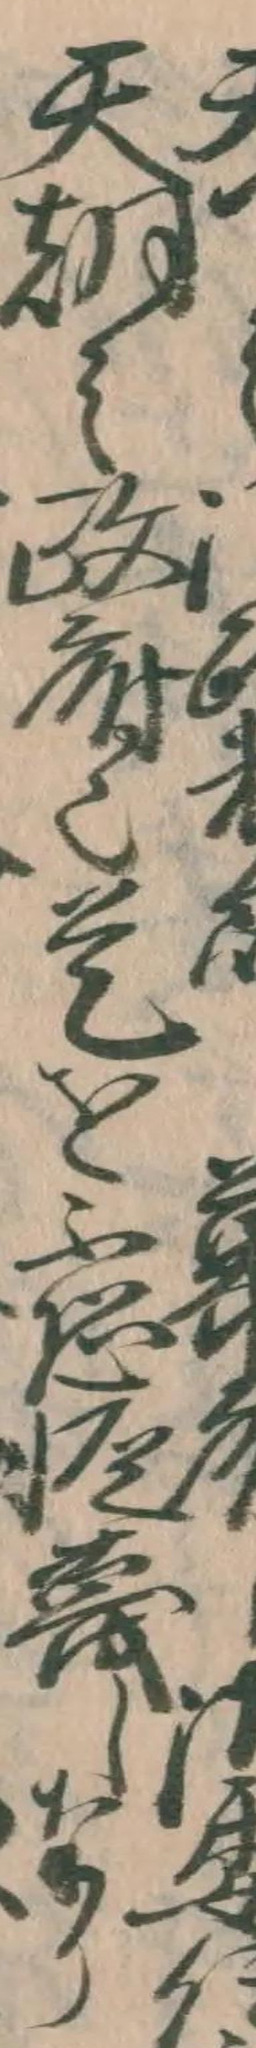天朝之政府也是を不恐軽蔑しなり
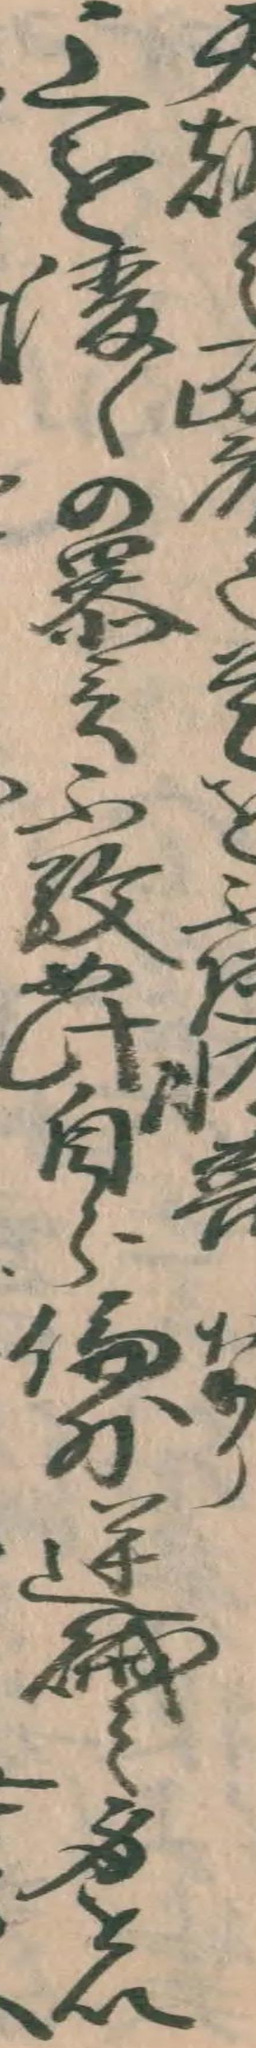上を凌くの暴言不敬如此自ら論外逆賊之身を以
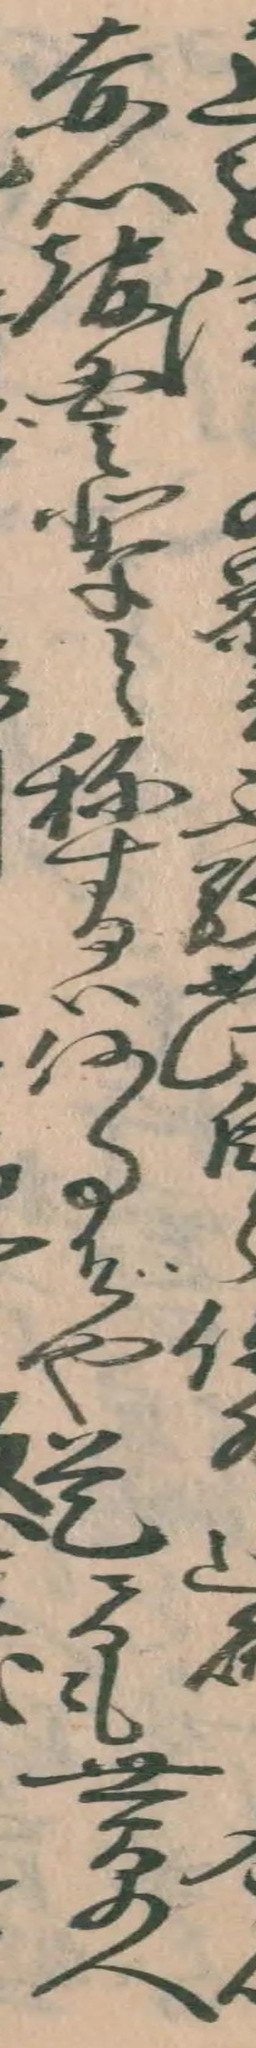赤心報国之輩と称するハ何事ぞや是二而も世間の人
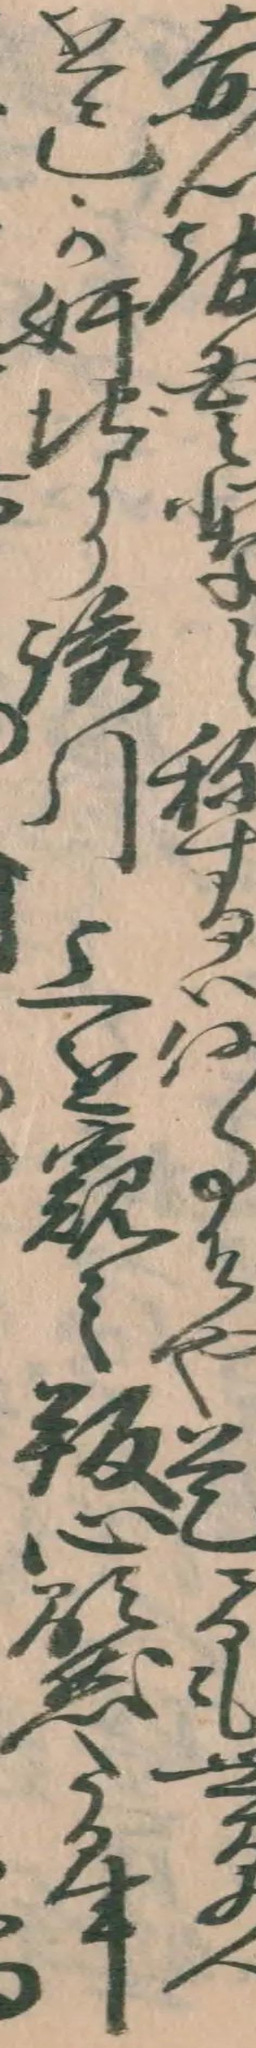を己か奸地より誘引上を窺之叛心顕然たる事
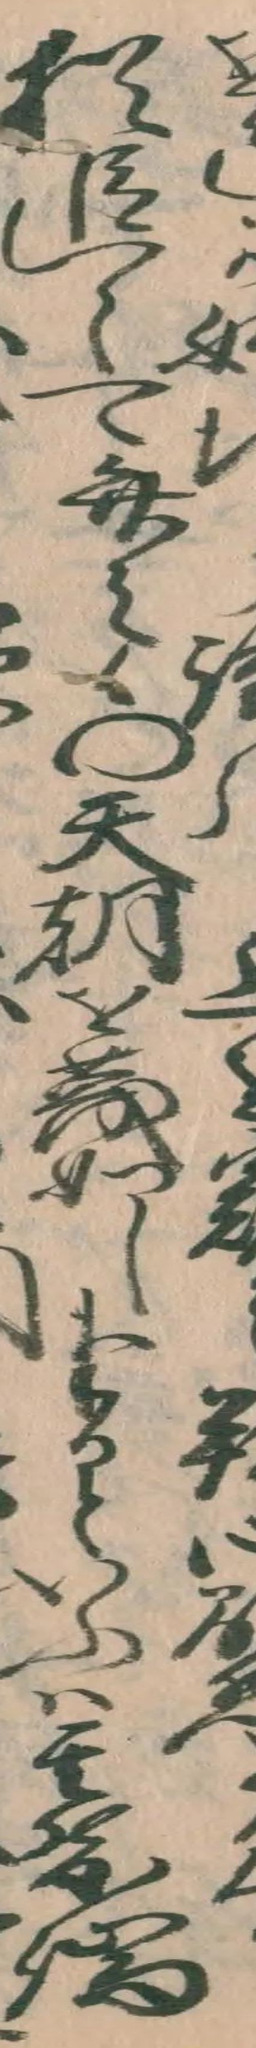猶追々可弁之候〇天朝を蔑如し奉るといふハ其発端
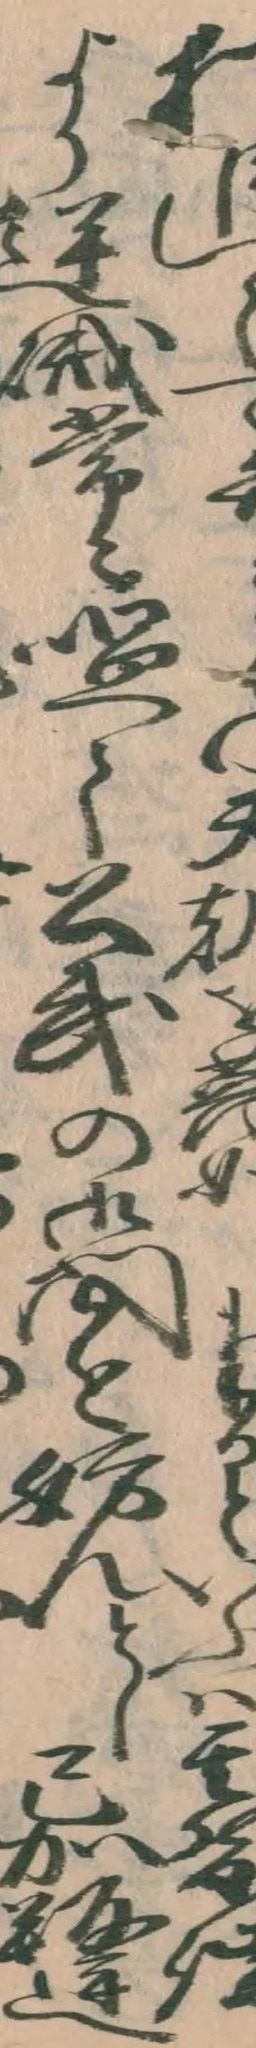より逆賊常ニ唱へて公武の御間を妨んとし己か叛逆
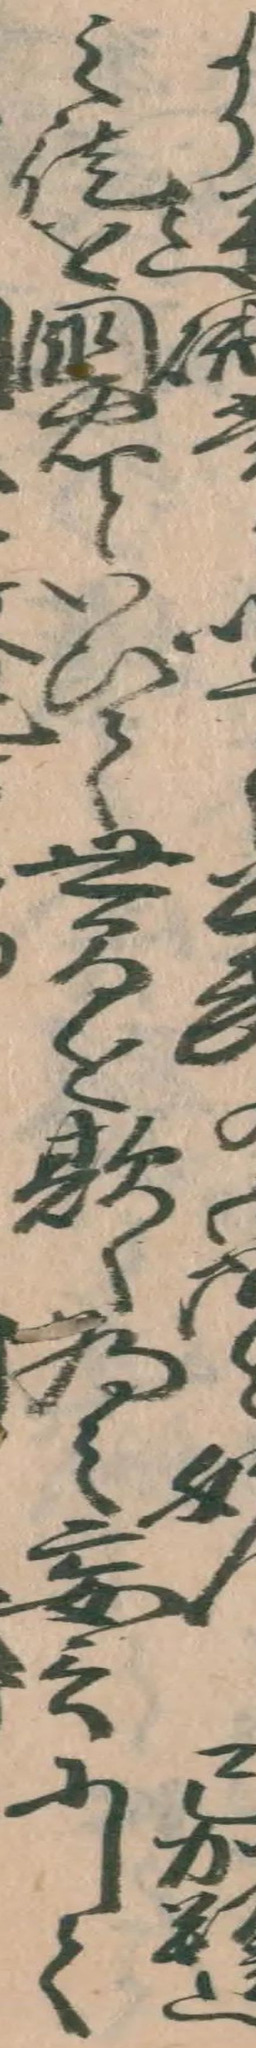之徒を国忠といひて世間を欺く為之妄言にして
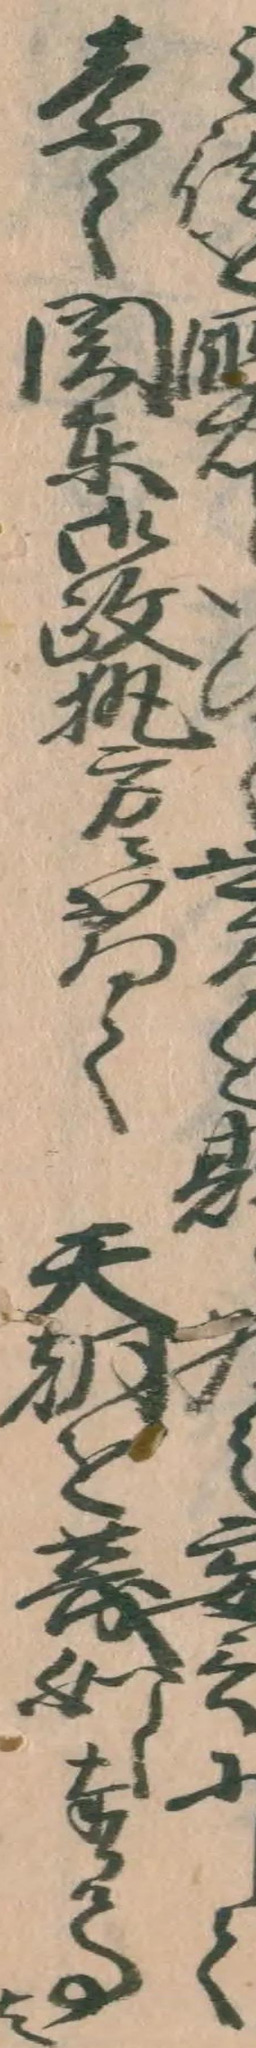素々関東御政執方ニおゐて天朝を蔑如し奉り候事者
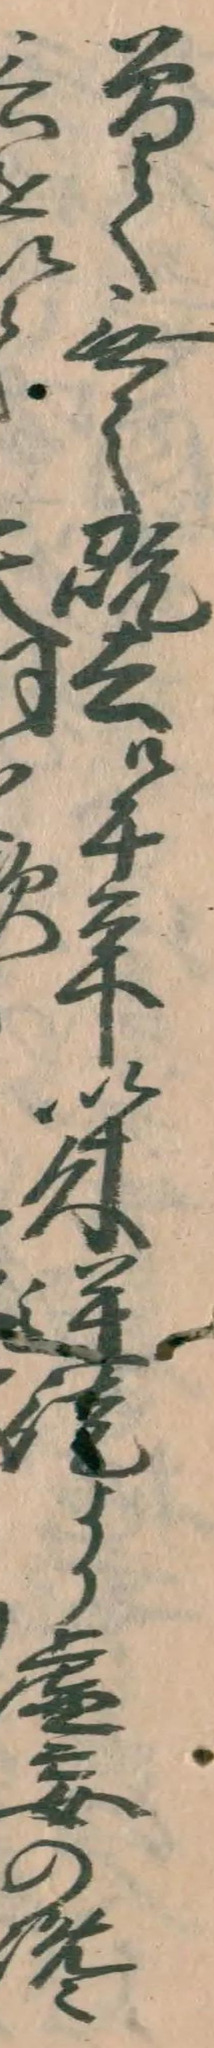曽て無之既去ル午年以来逆徒より虚妄の讒
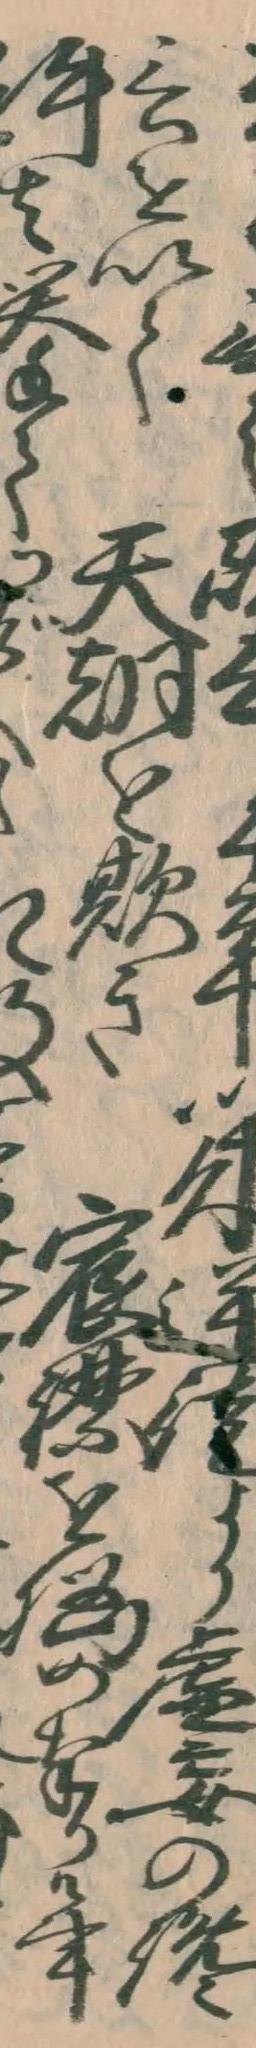言を以て天朝を欺き宸襟を悩め奉り候事
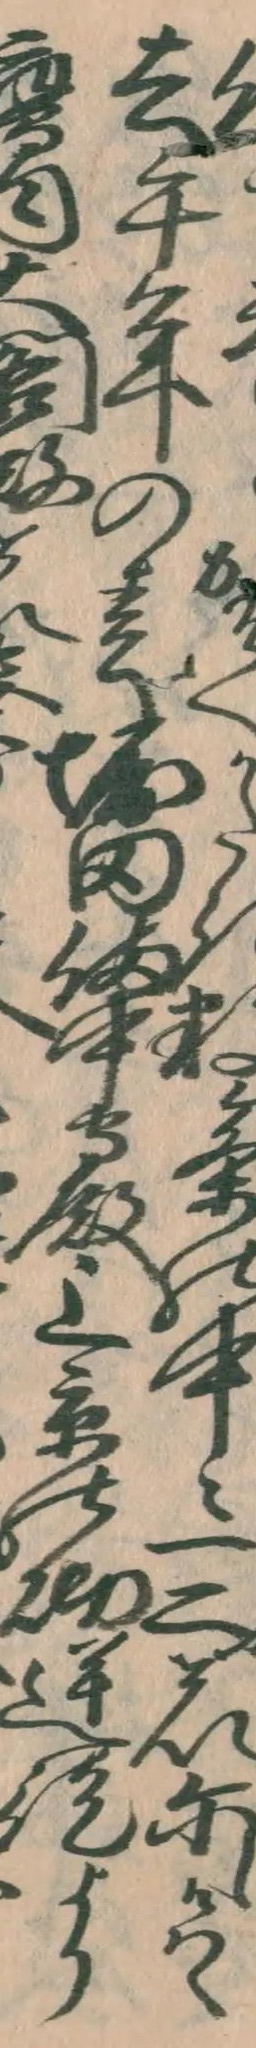去午年の春堀田備中守殿上京の砌逆徒より
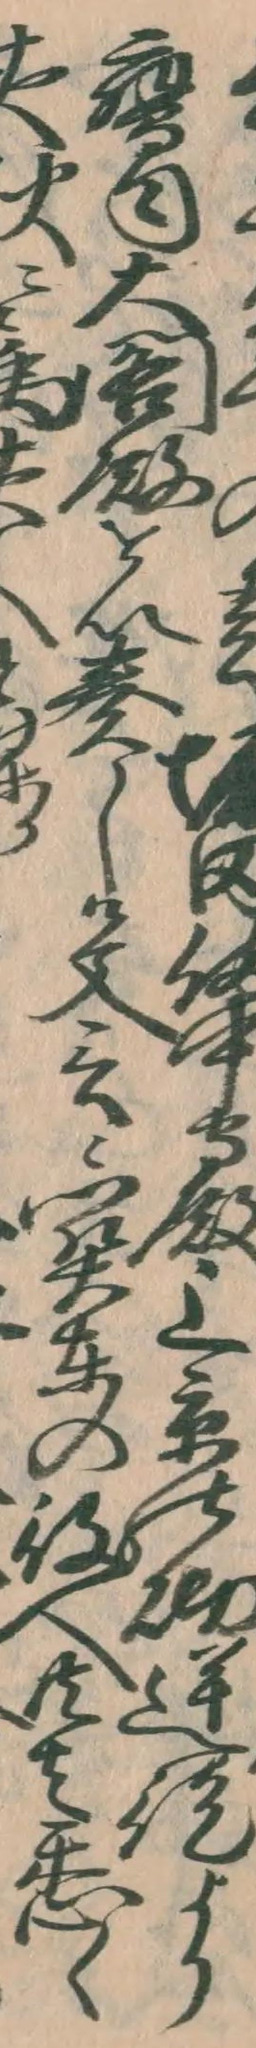鷹司大閤殿を以奏し候文言ニ関東の役人共者悉く
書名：麗斎叢書. 20
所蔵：国立国会図書館 National Diet Library, JAPAN
